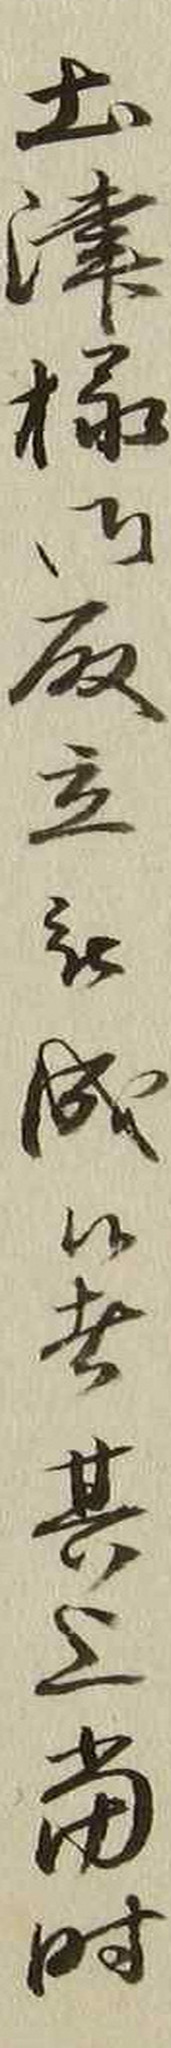土津様御殿立被成候者其上当時
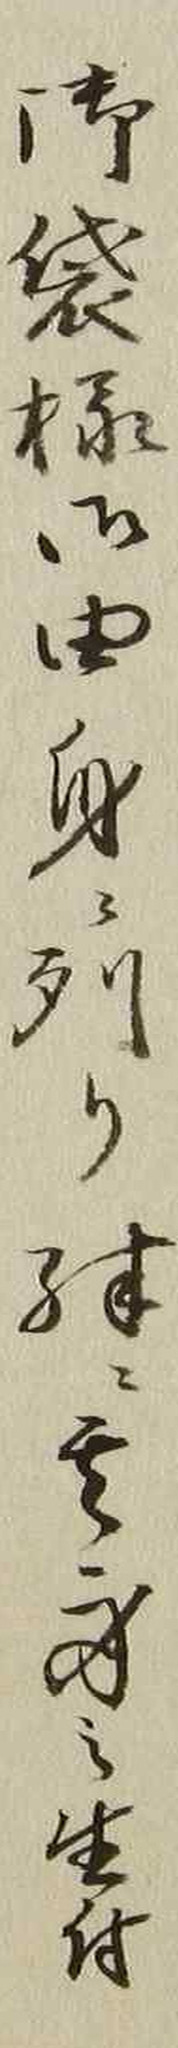御袋様御由身に別り殊に其身之生付
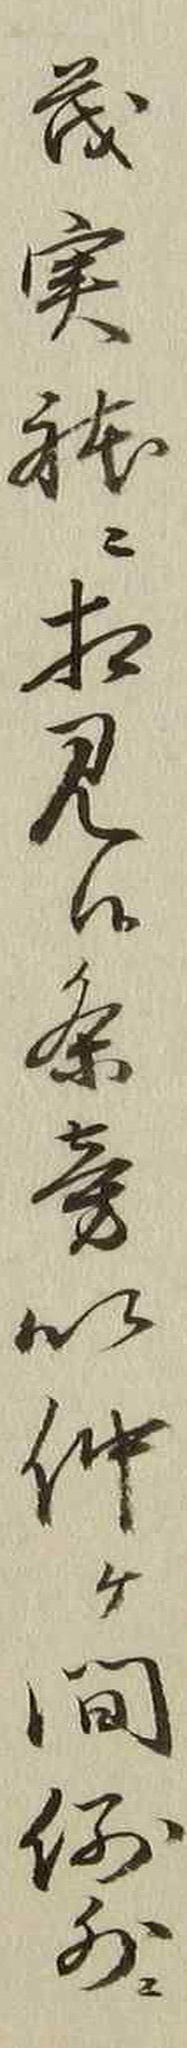も実体に相見候条旁以仲ケ間例外に
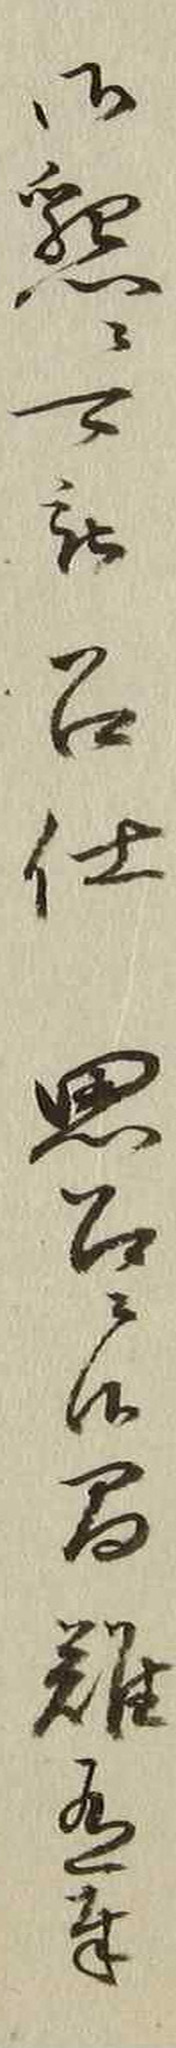御懇に可被召仕思召に候間難有奉
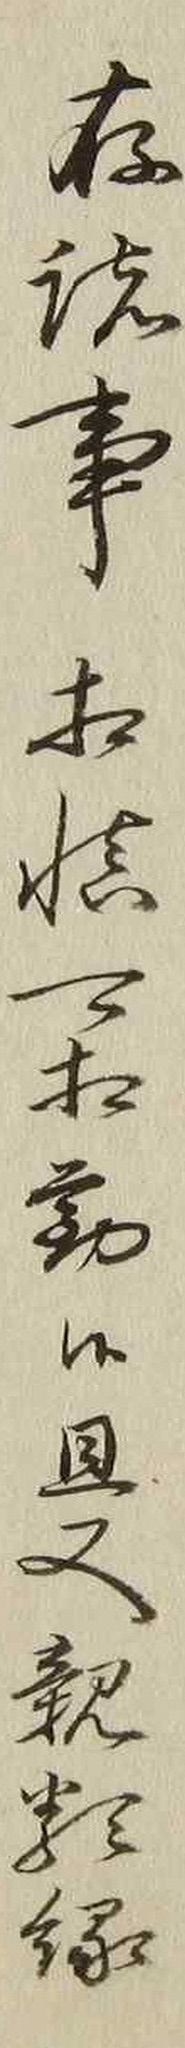存諸事相慎可相勤候且又親類縁
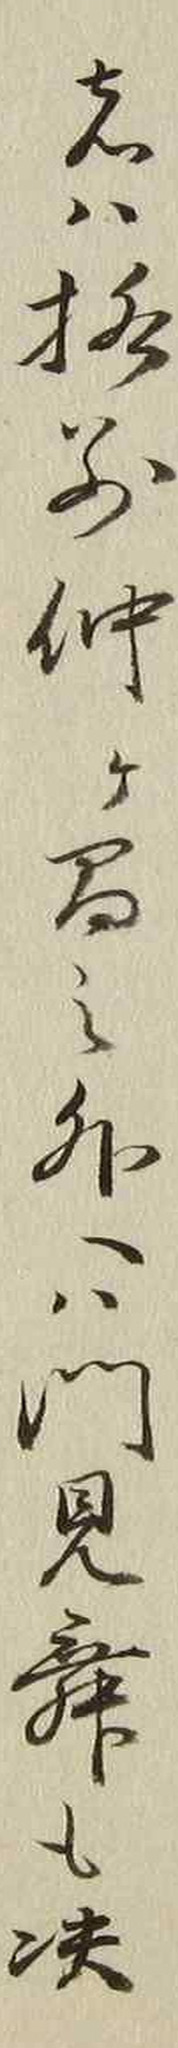者は格別仲ケ間之外へは門見舞も決
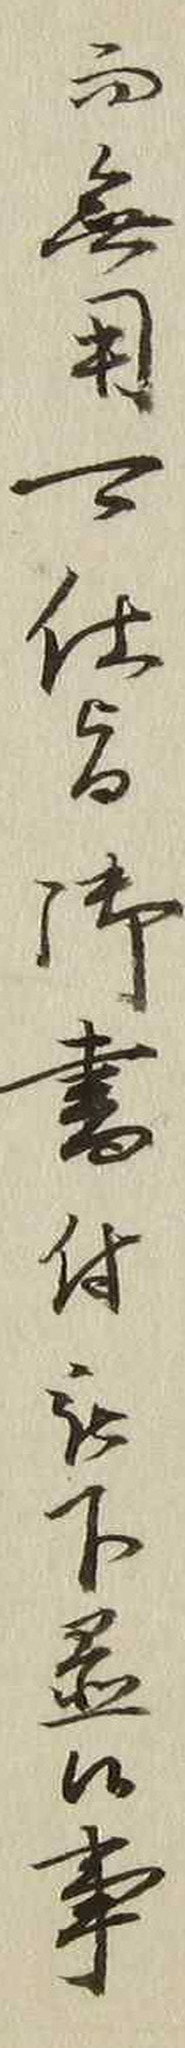而無用可仕旨御書付被下置候事
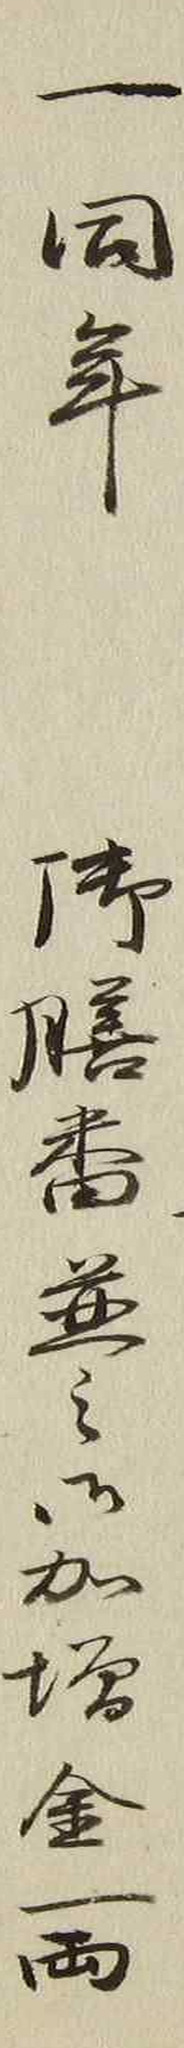一同年御膳番並之御加増金一両
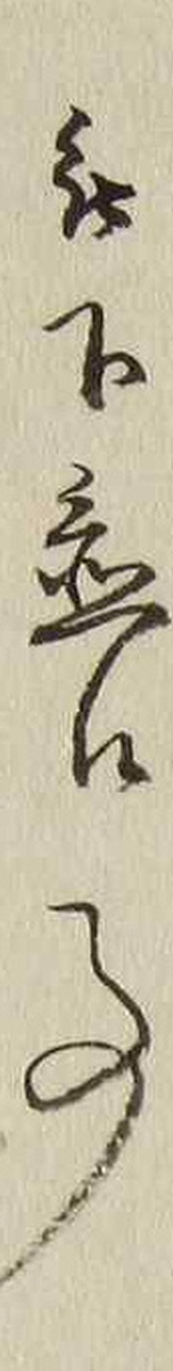被下置候事
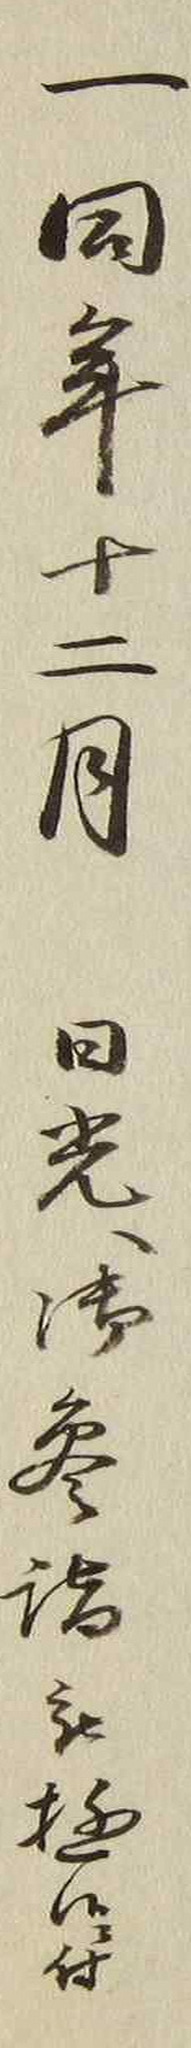一同年十二日光御参詣被遊候に付ニ
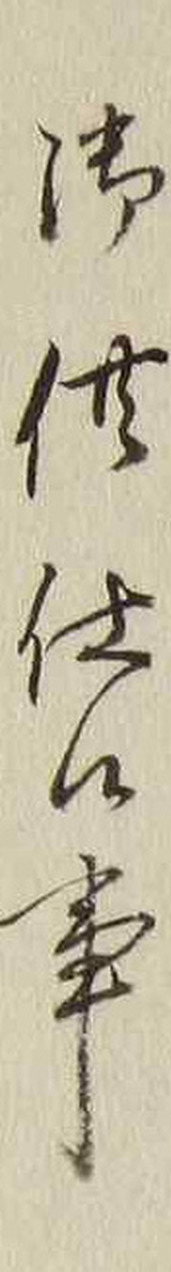御供仕候事
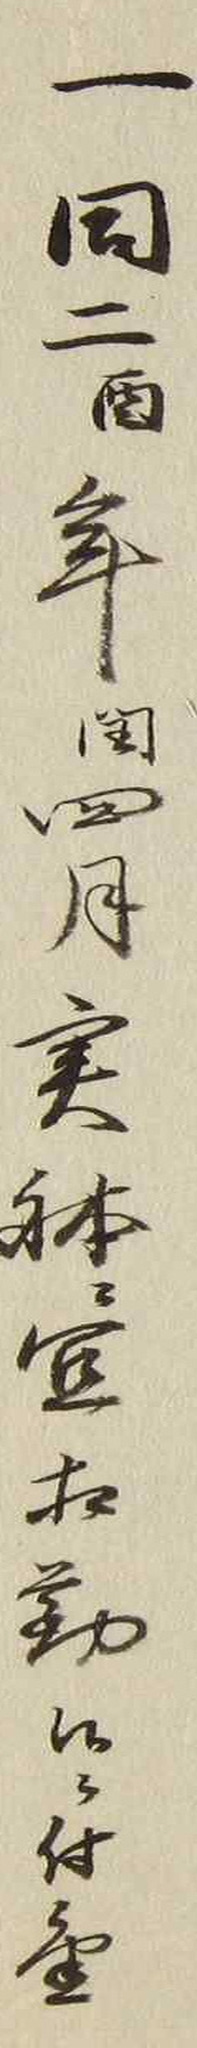一同酉年閏四月実体に宜相勤候に付金
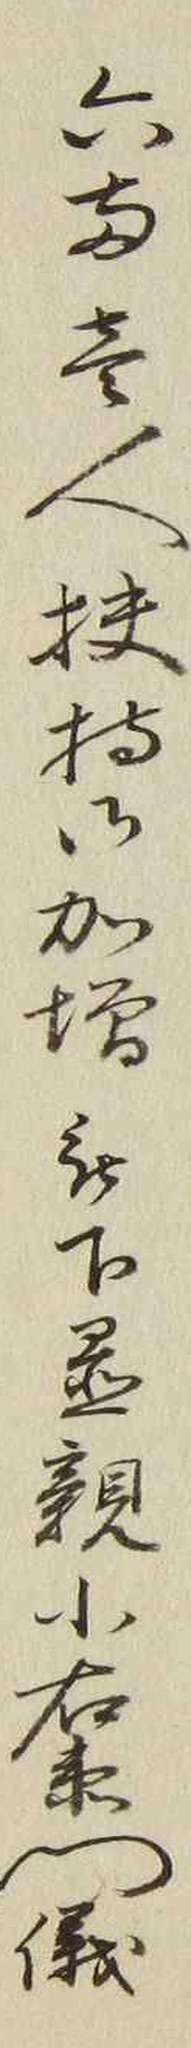六両壱人扶持御加増被下置親小右衛門儀
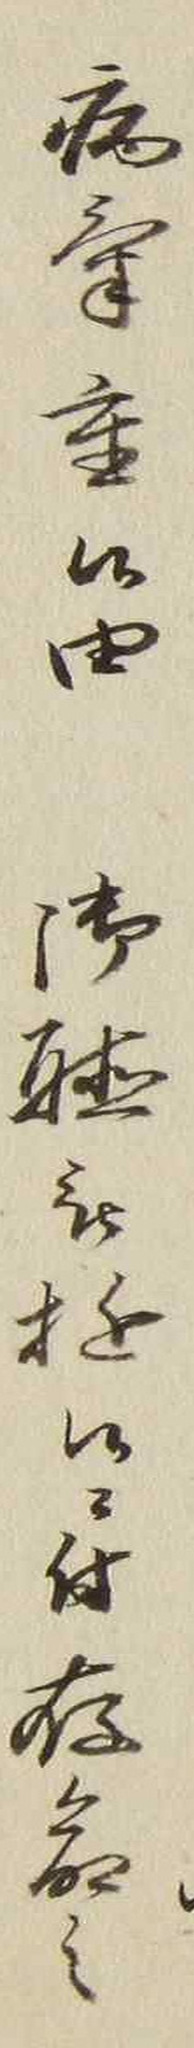病気重候由御聴被遊候に付存名之

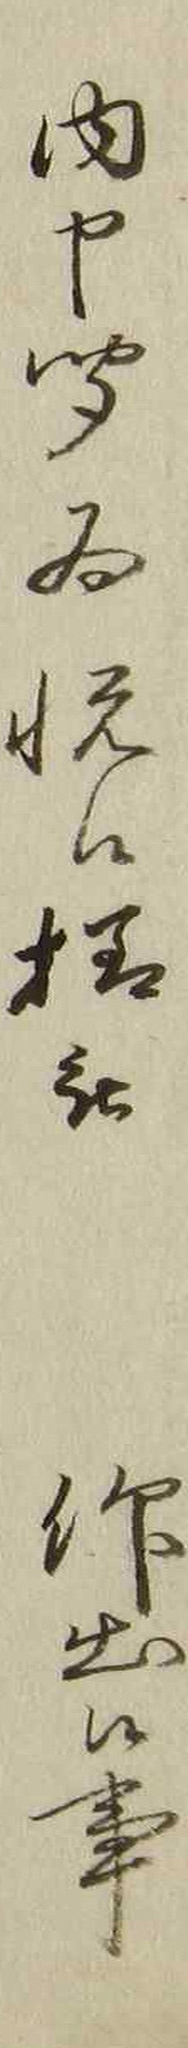内申聞為悦候様被仰出事候
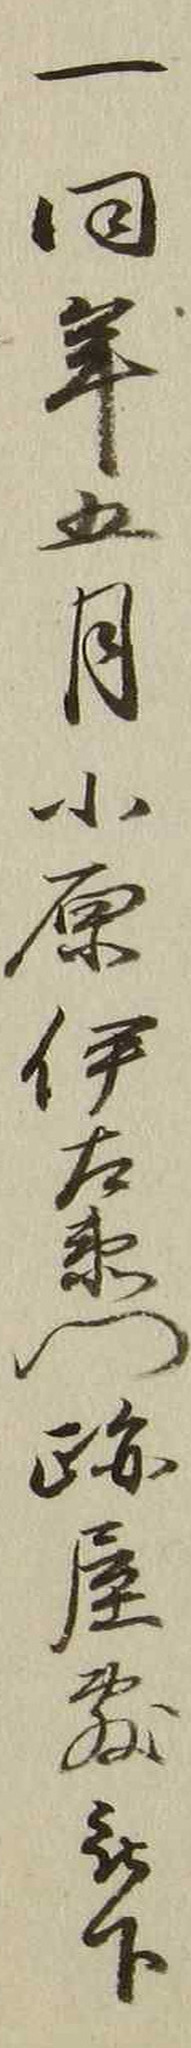一同年五月小原伊右衛門跡屋敷被下
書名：諸士系譜　巻之133　た之部9
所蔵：会津若松市立会津図書館
